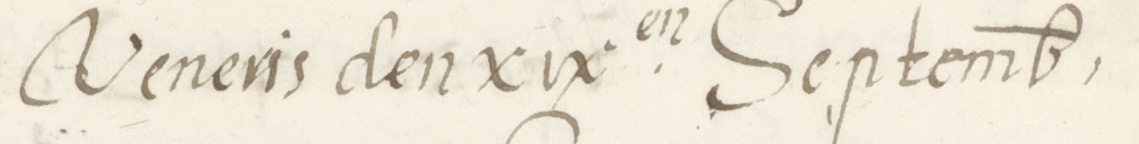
Veneris den xixen Septemb,
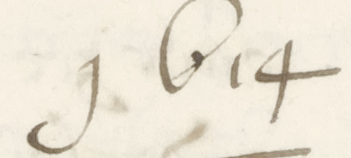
1614
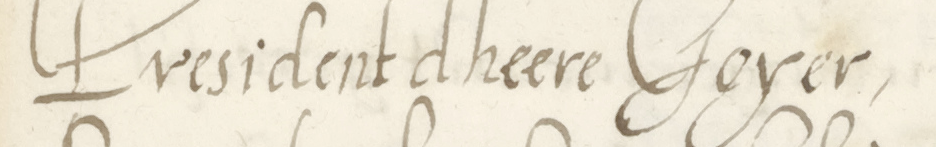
President dheere Goyer,
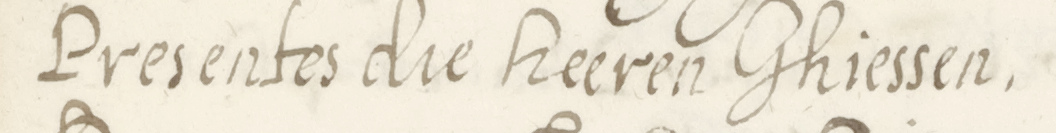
presentes die heeren Ghiessen,
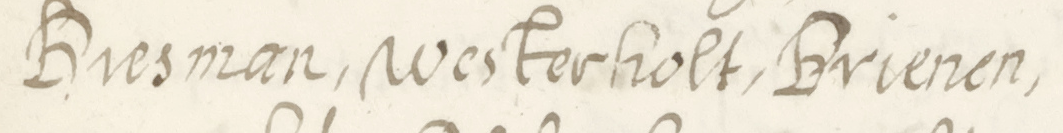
Biesman, Westerholt, Brienen,
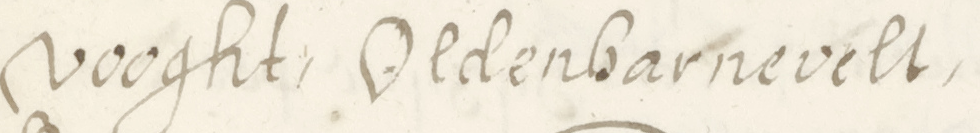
Vooght, Oldenbarnevelt,
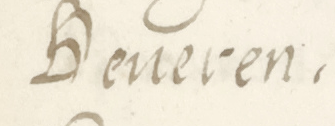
Beueren,
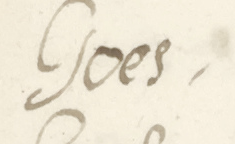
Goes,
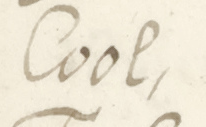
Cool,
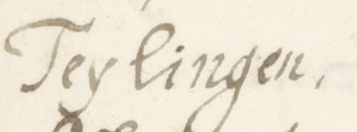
Teylingen,
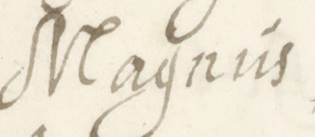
Magnus,
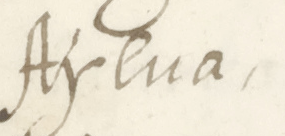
Aylua,
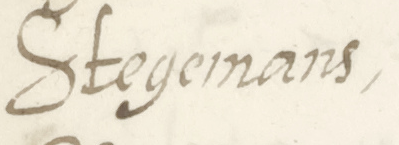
Stegemans,
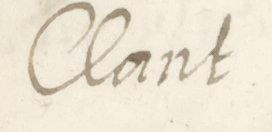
Clant
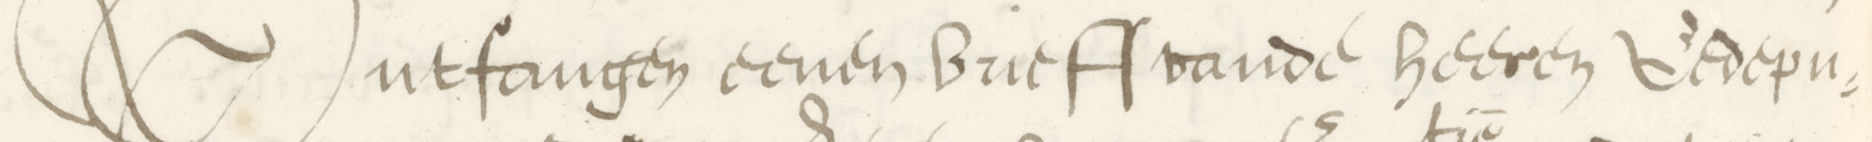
Ontfangen eenen brieff vande heeren Gedepu„
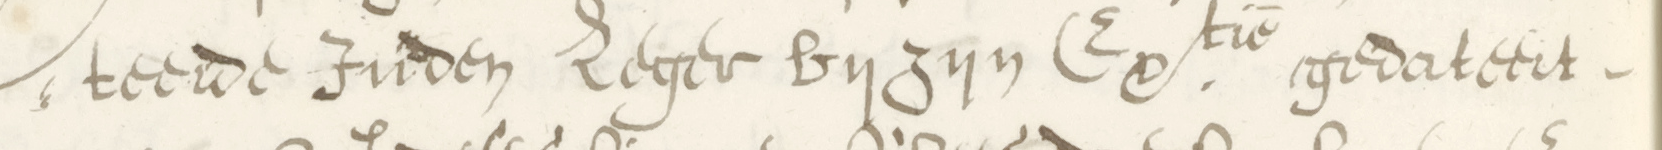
,,teerde Inden Leger by zyn Extie gedateert -
